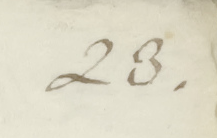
23.
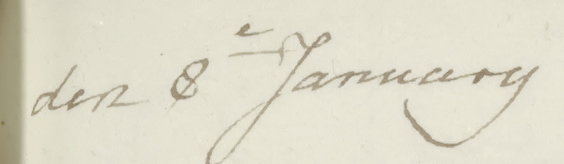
den 8e January
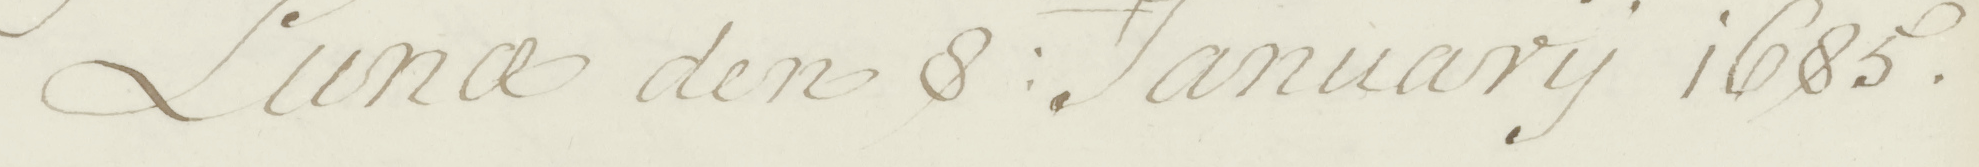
Lunæ den 8e: Januarij 1685.
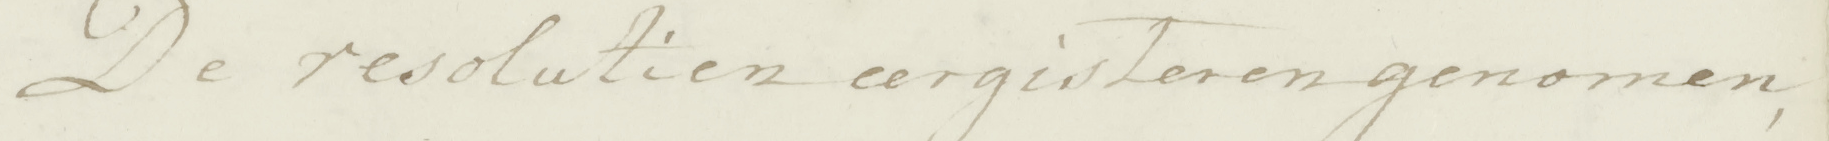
De resolutien eergisteren genomen,
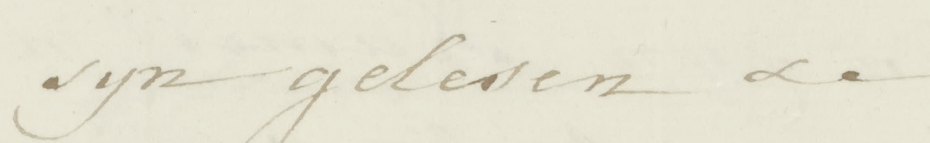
sijn gelesen de
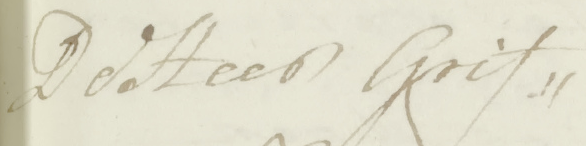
De Heer Grif„
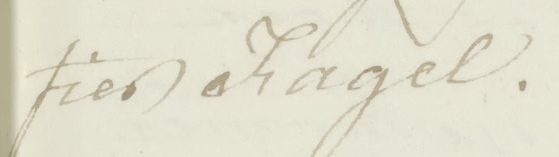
fier Fagel.
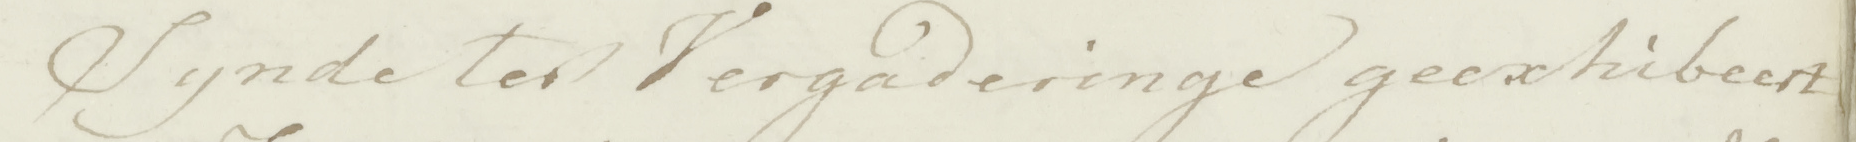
Sijnde ter Vergaderinge geexhibeert
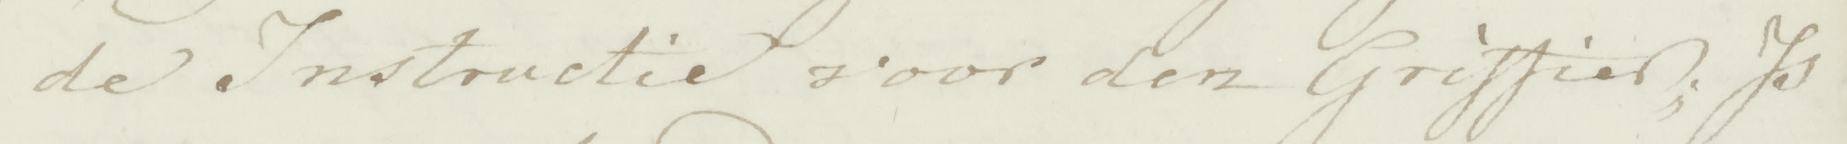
de Instructie voor den Griffier; Is
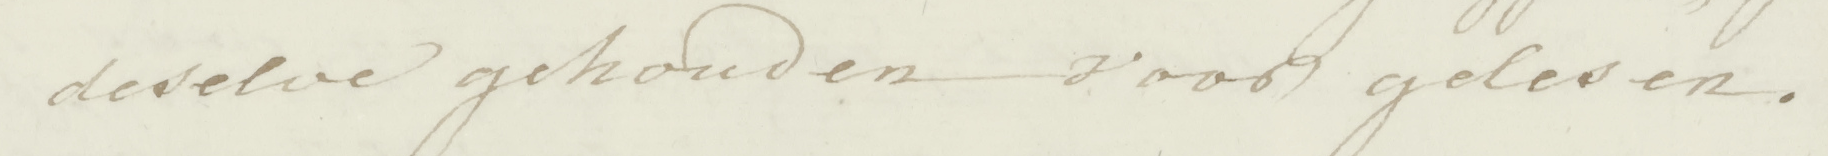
deselve gehouden voor gelesen.
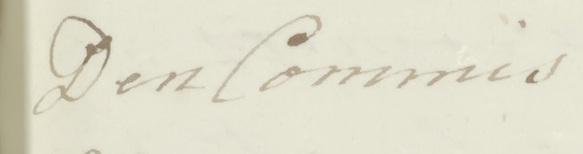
Den Commis
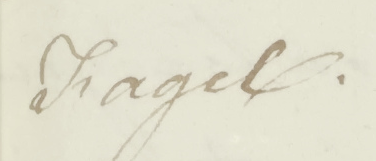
Fagel.
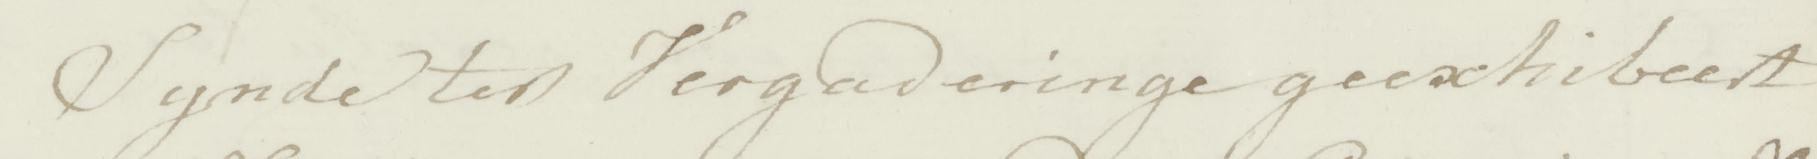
Sijnde ter Vergaderinge geexhibeert
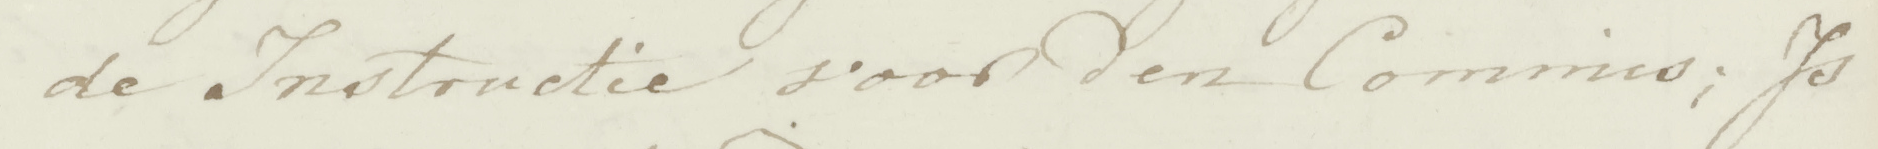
de Instructie voor den Commis, Is
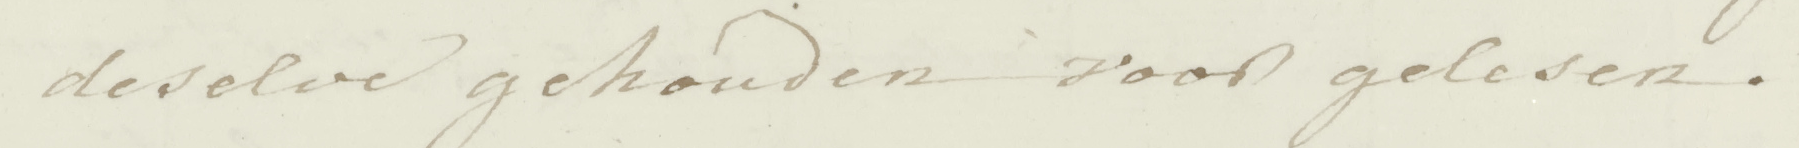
deselve gehouden voor gelesen.
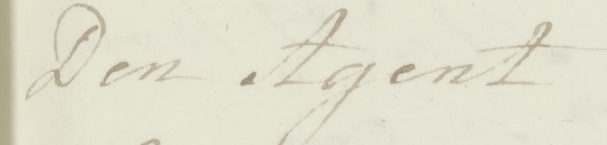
Den Agent
